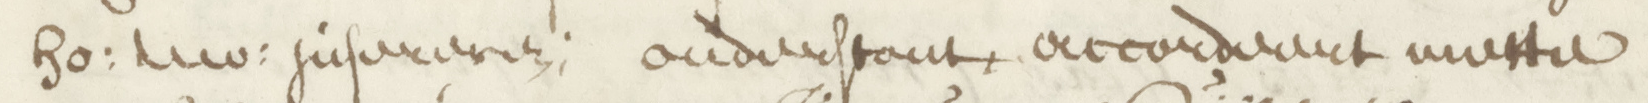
Ho:Mo: insereren: onderstont, accordeert mette
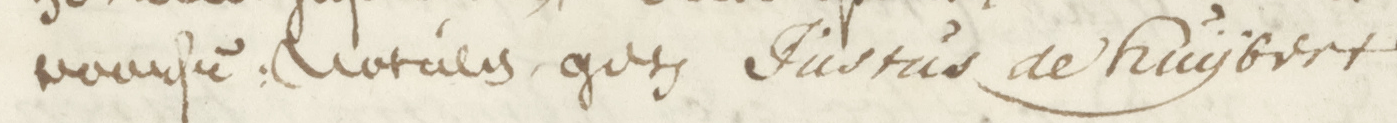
voorsr Notulen, get Justus de Huijbert
